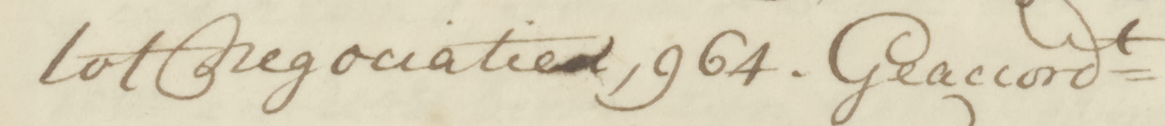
tot negociatie, 964, Geaccort
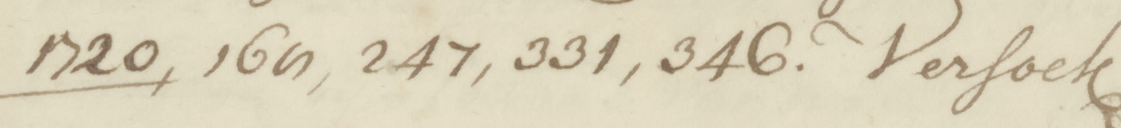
1720, 168, 247, 331, 346. Versoek
